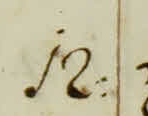12:
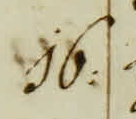16:
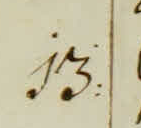13:
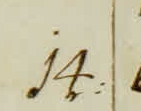14:
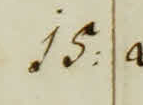15:
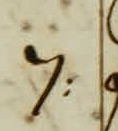7:
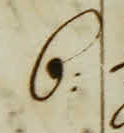6:
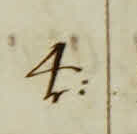4:
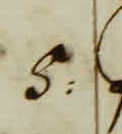5:
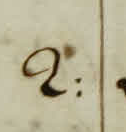2:
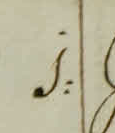1:
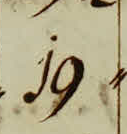19
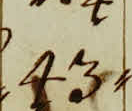43
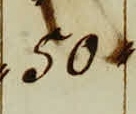50
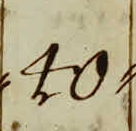40
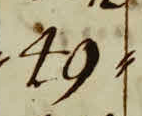49
